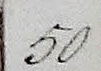50
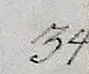34
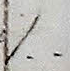1.
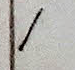1
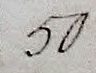50
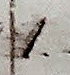1.
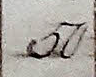50
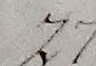27
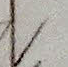1
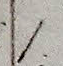1
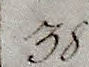38
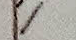1
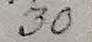30
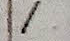1
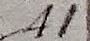41
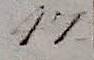47
